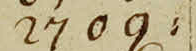2709
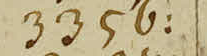3356:
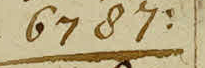6787:
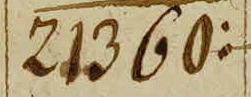21360
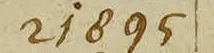21895
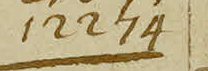12274
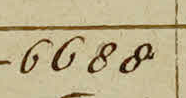6688
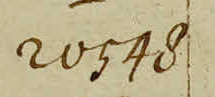20548
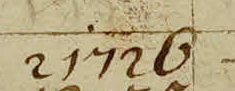21726
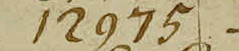12975
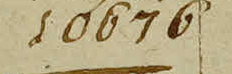10676
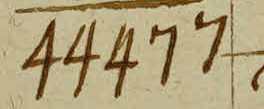44477
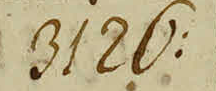3126:
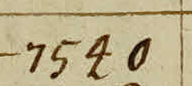7540
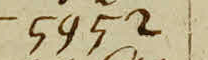5952
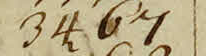3467
